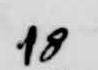18
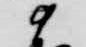9
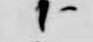1
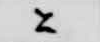2
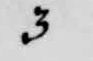3
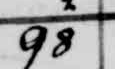98
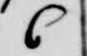6
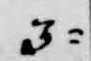3
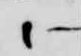1
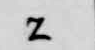2
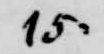15
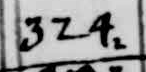324.
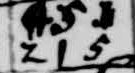215
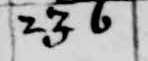236
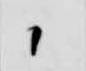1
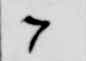7
